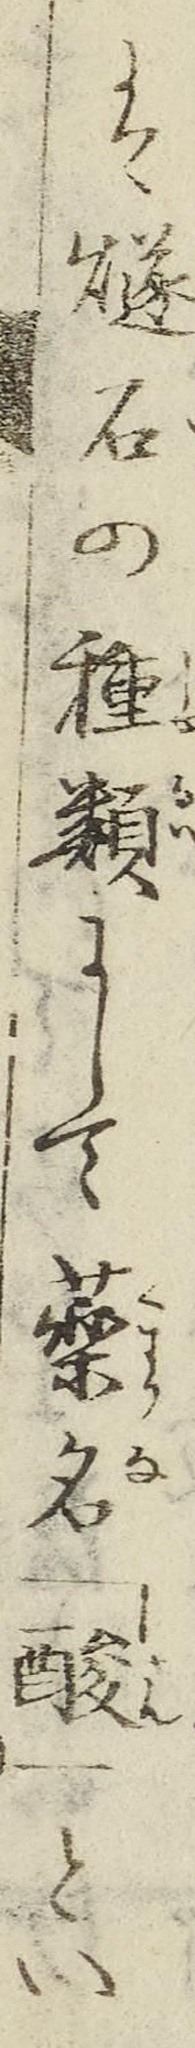は燧石の種類にして薬名「酸」とい

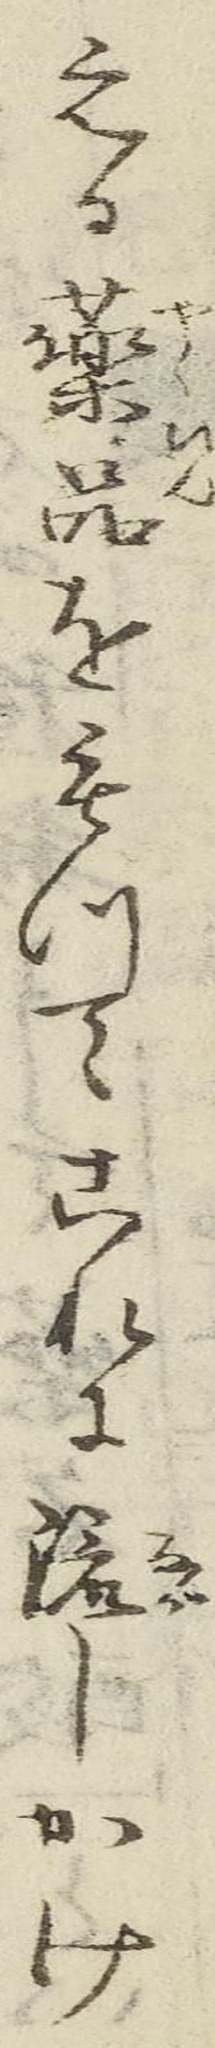える薬品をもつてこれに流しかけ
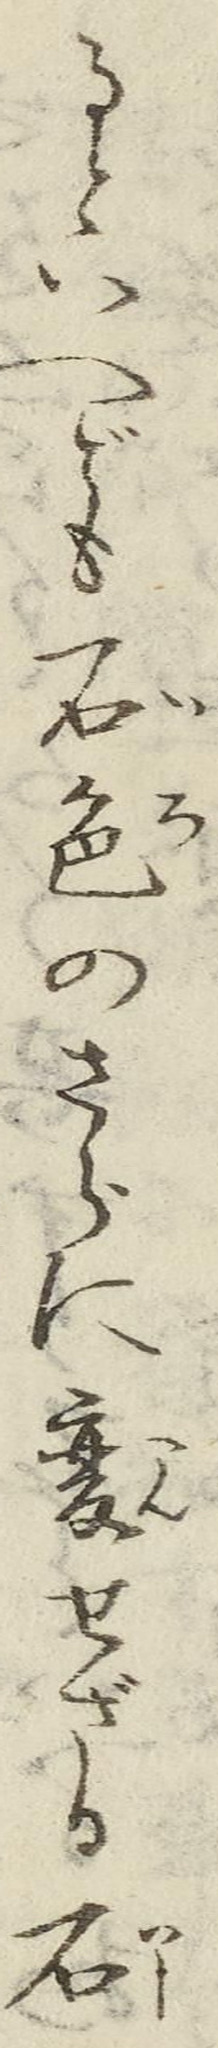るといへども石色のさらに変せざる石
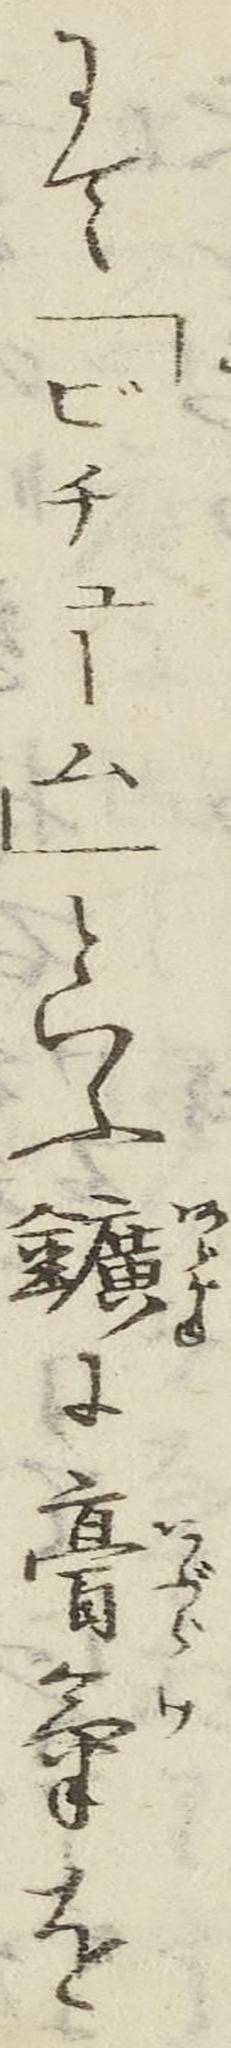にて「ビチューム」といふ鉱に膏気を
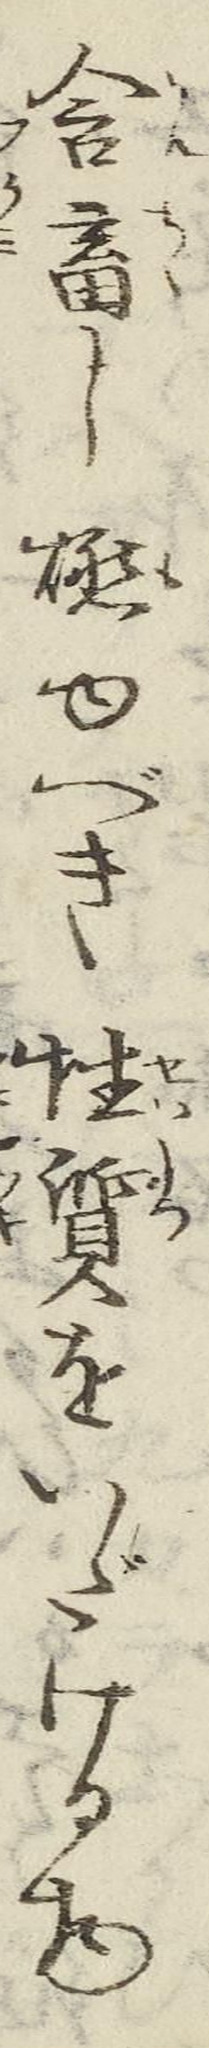含蓄し燃ゆべき性質をいだける物
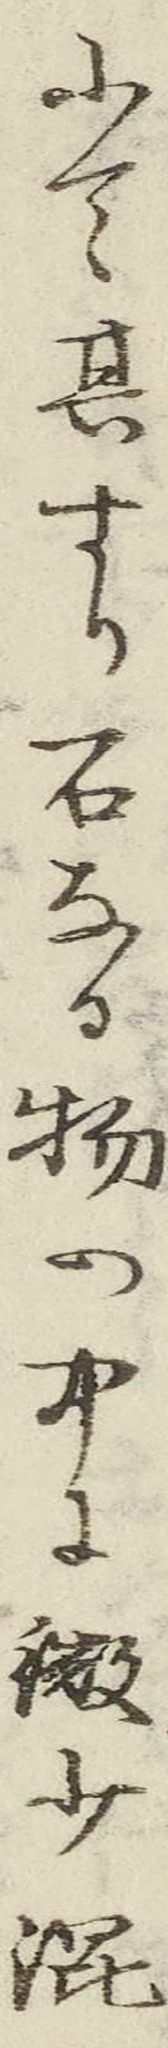にて其すり石なる物の中に微少混
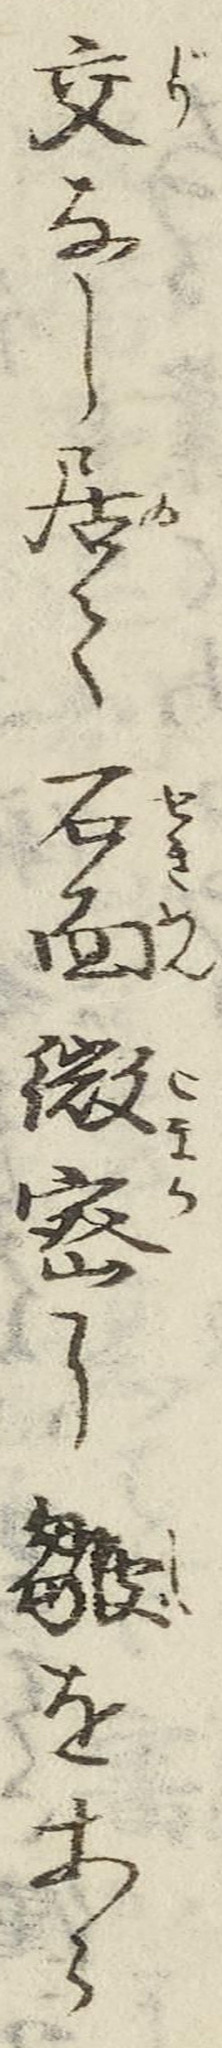交なし居て石面微密に皺をあら
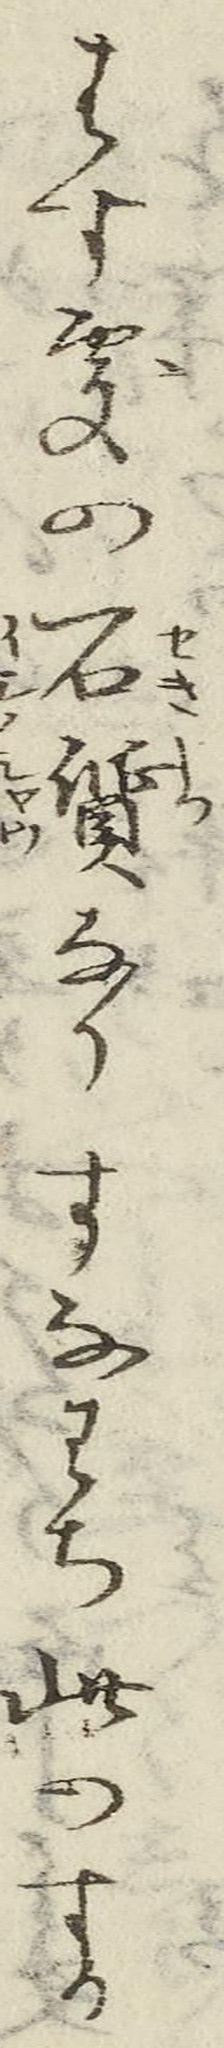はす処の石質なりすなはち此のすり
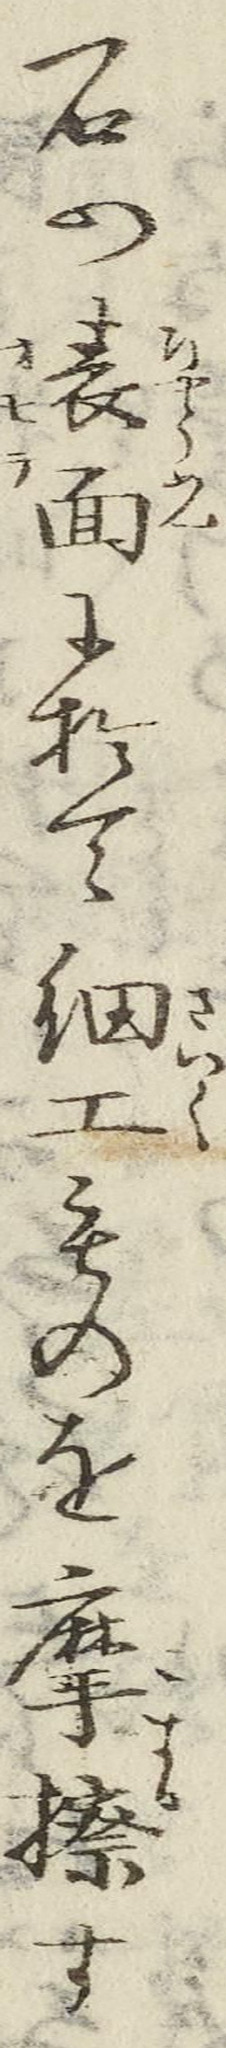石の表面に於て細工ものを摩擦す
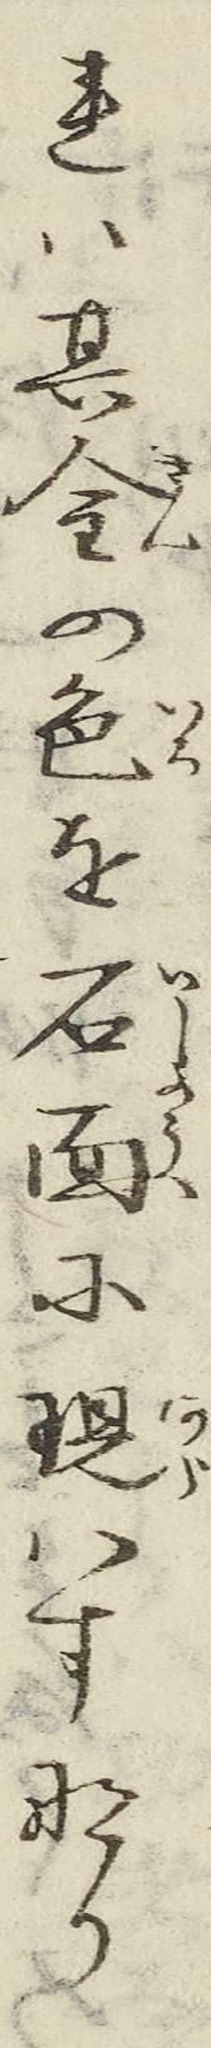れは其金の色を石面に現はすなり
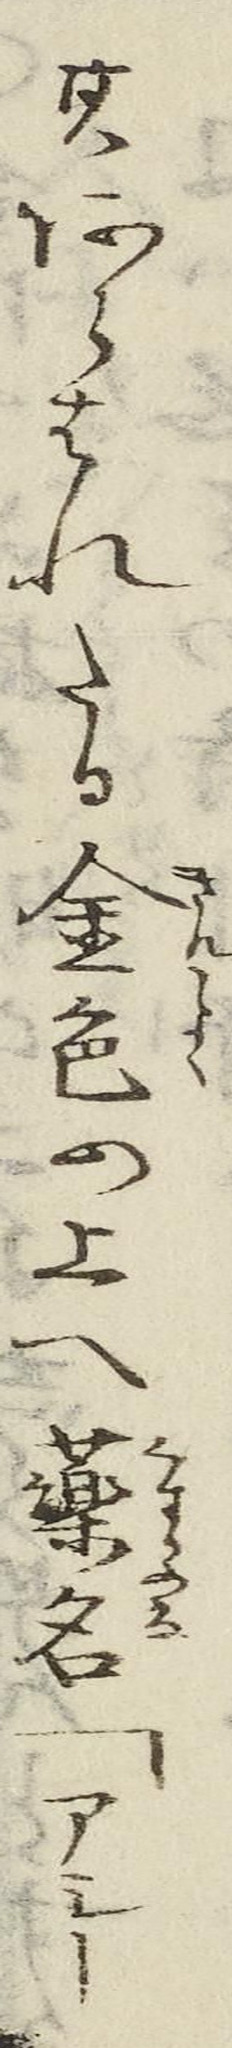其あらはれたる金色の上へ薬名「アシー
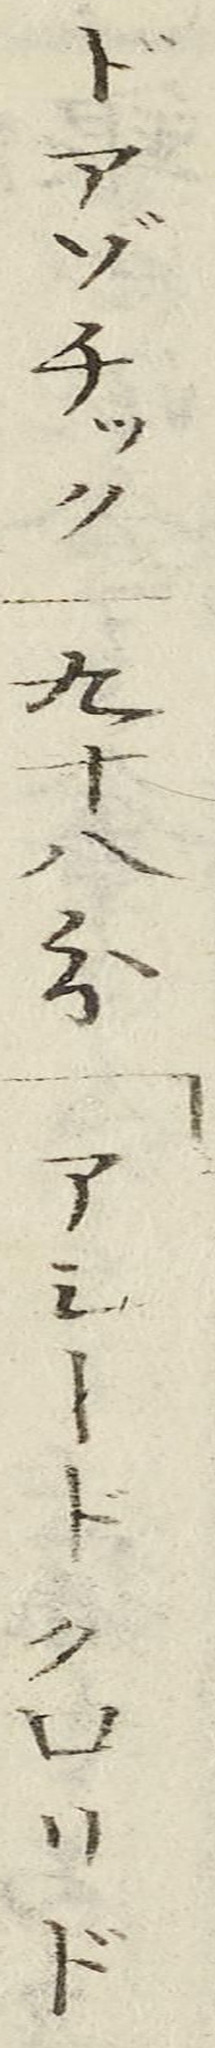ドアゾチック」九十八分「アシートクロリド
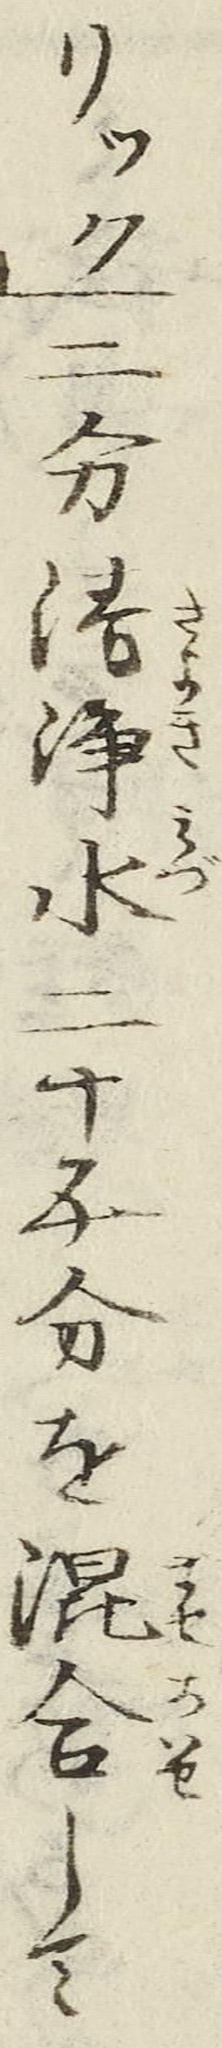リック」二分清浄水二十五分を混合して
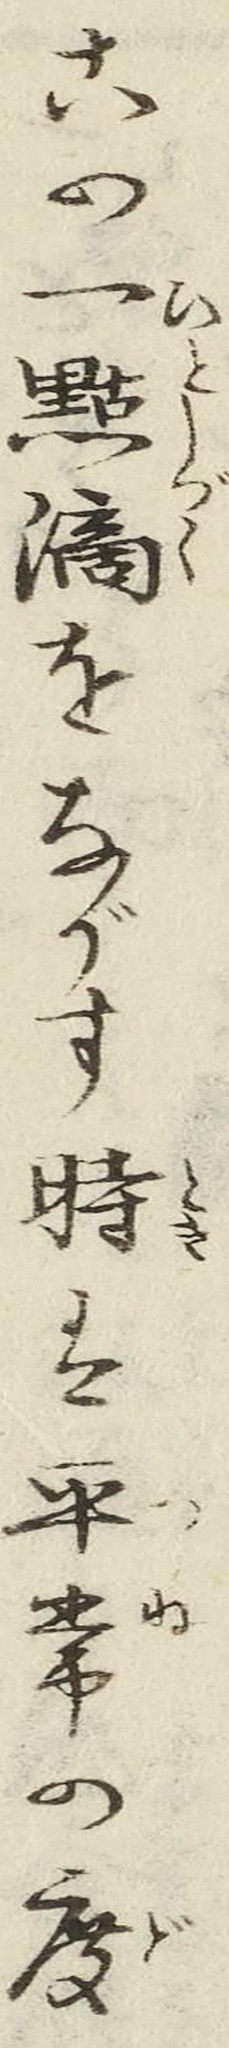この一点滴をながす時は平常の度
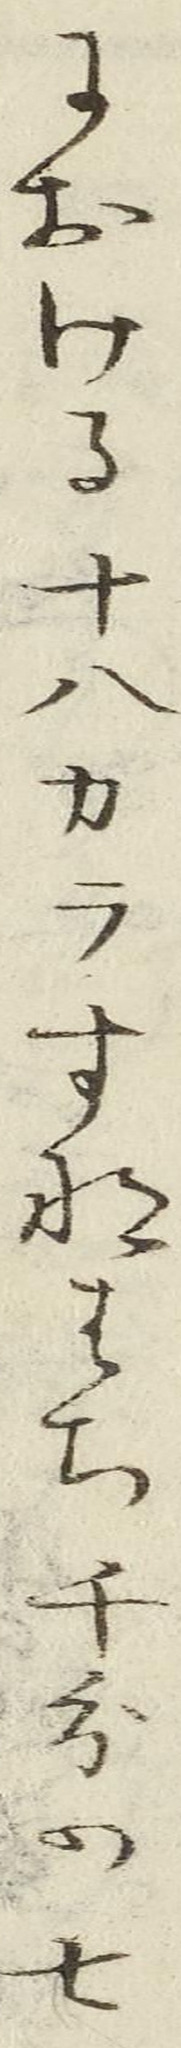における十八カラすなはち千分の七
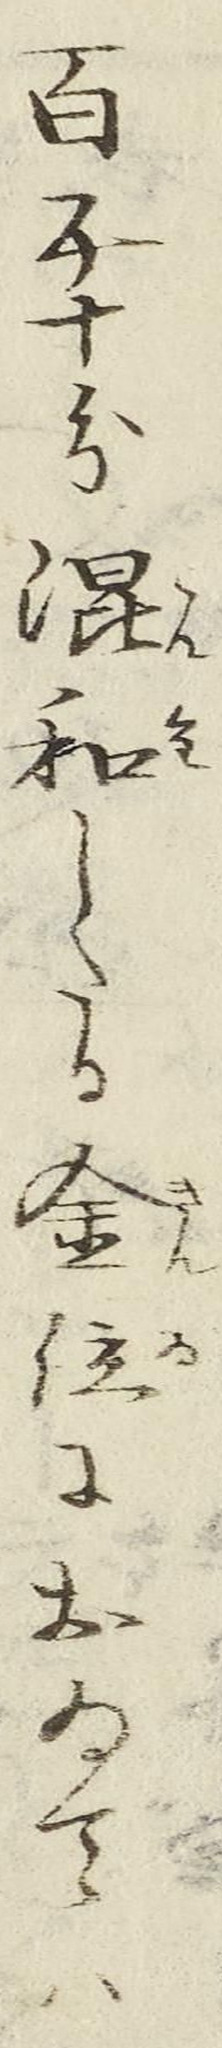百五十分混和したる金位におゐては
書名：[時計に関する冊子]
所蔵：東京大学地震研究所図書室 Earthquake Research Institute Library, The University of Tokyo, JAPAN
